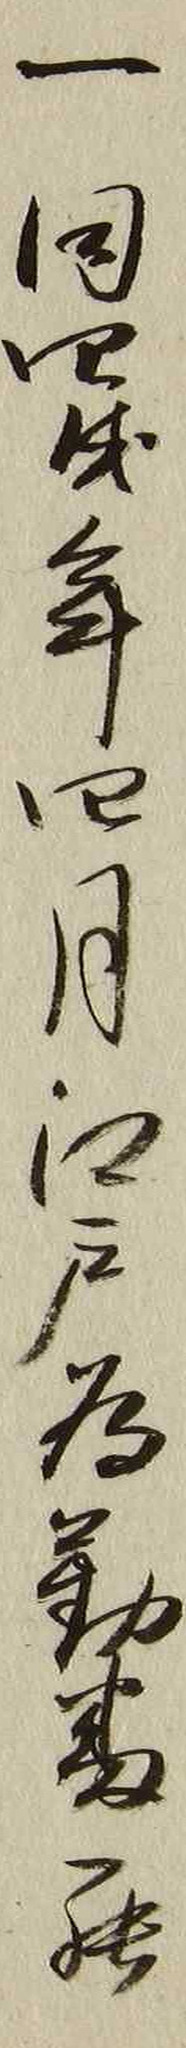一同四戌年四月江戸為勤番罷
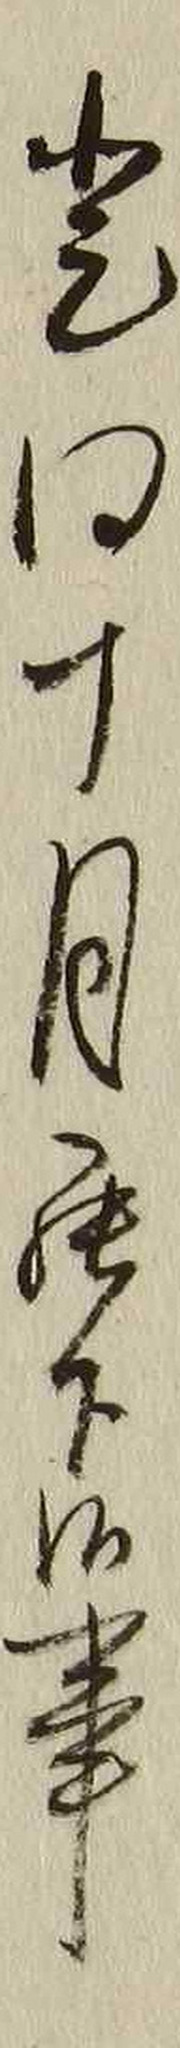登同十月罷下候事
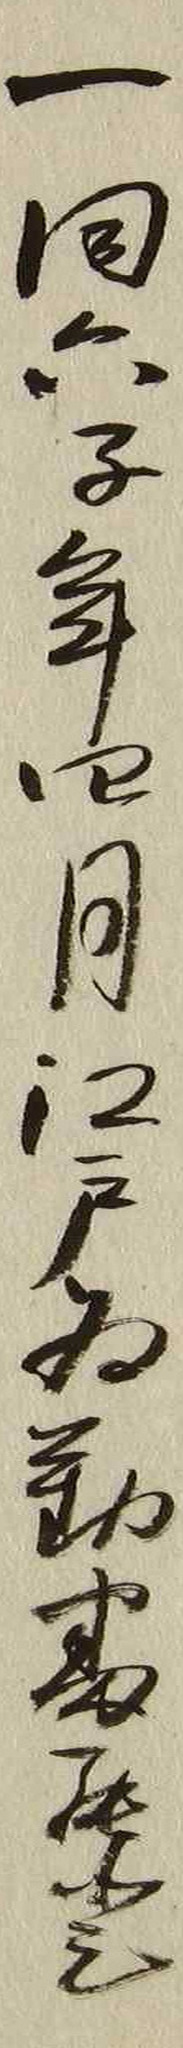一同六子年四月江戸為勤番罷登
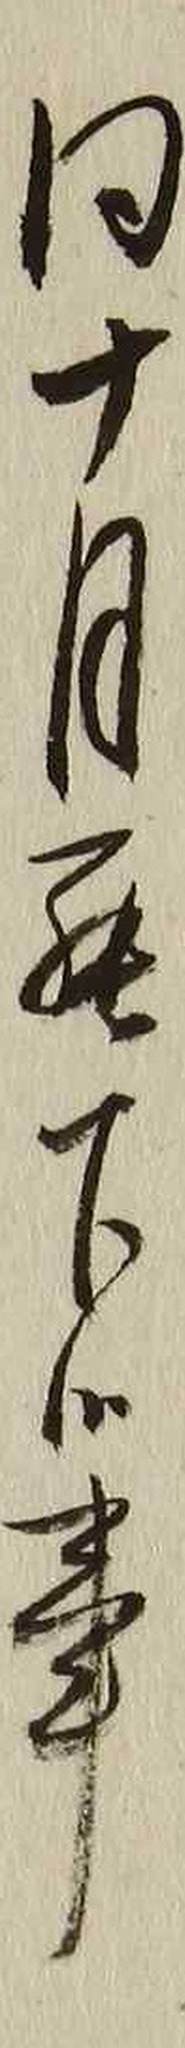同十月罷下候事
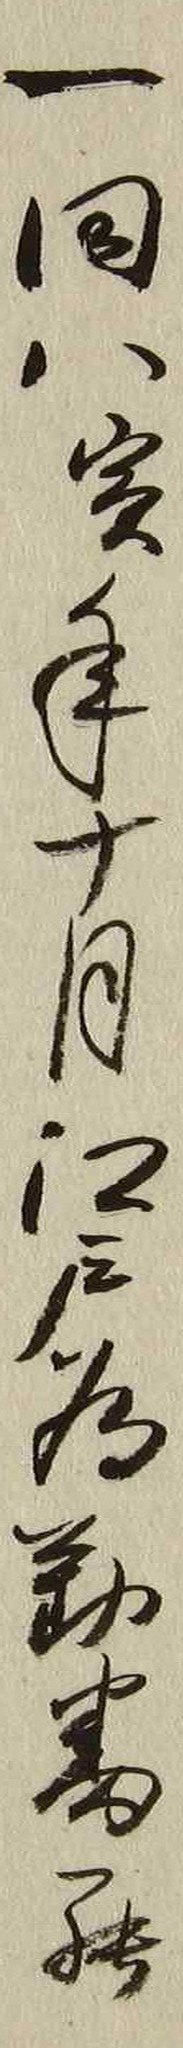一同八寅年十月江戸為勤番罷
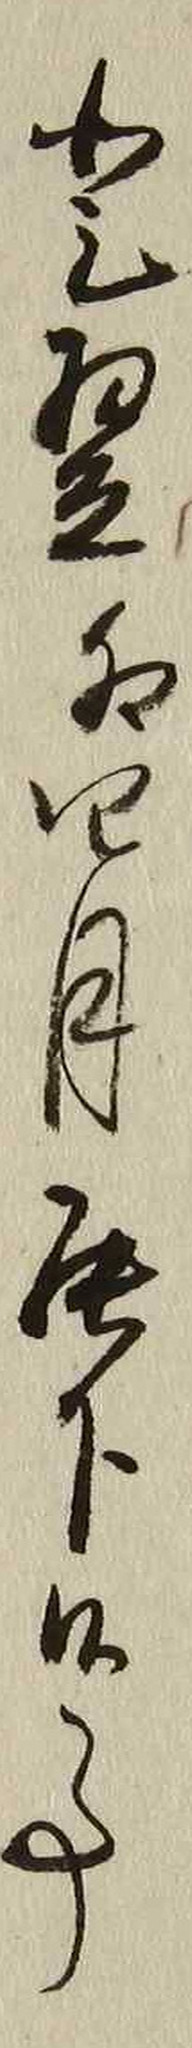登翌卯四月罷下候事
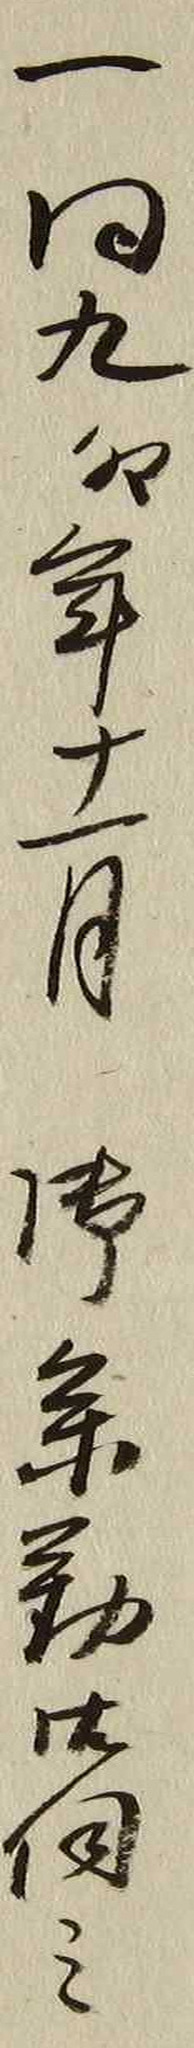一同九卯年十一月御参勤御伺之
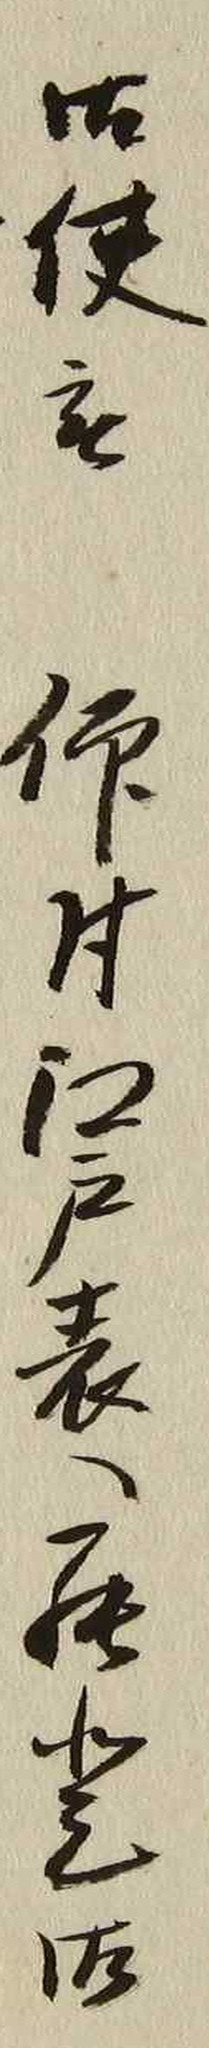御使被仰付江戸表へ罷登御
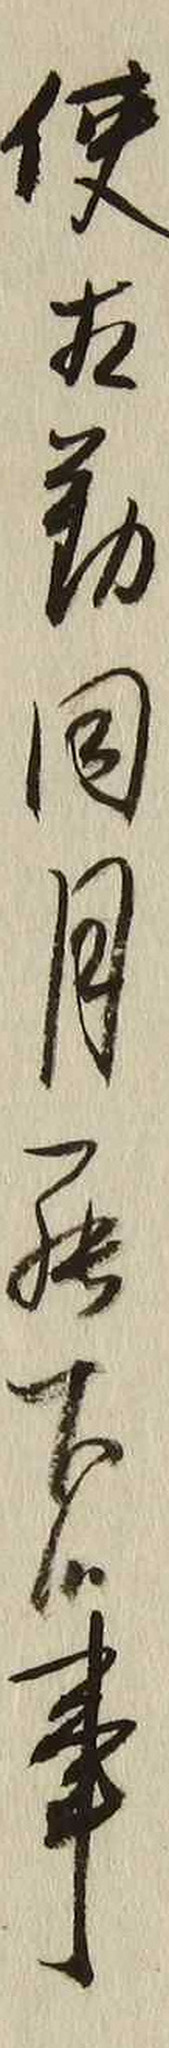使相勤同月罷下候事
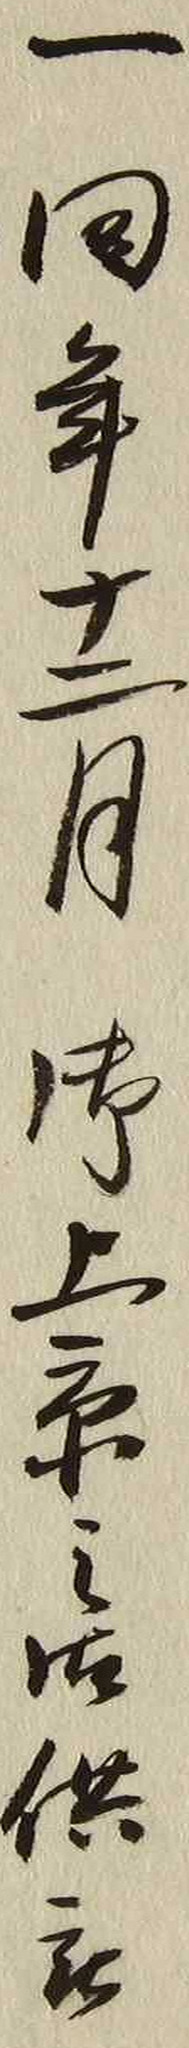一同年十二月御上京之御供被
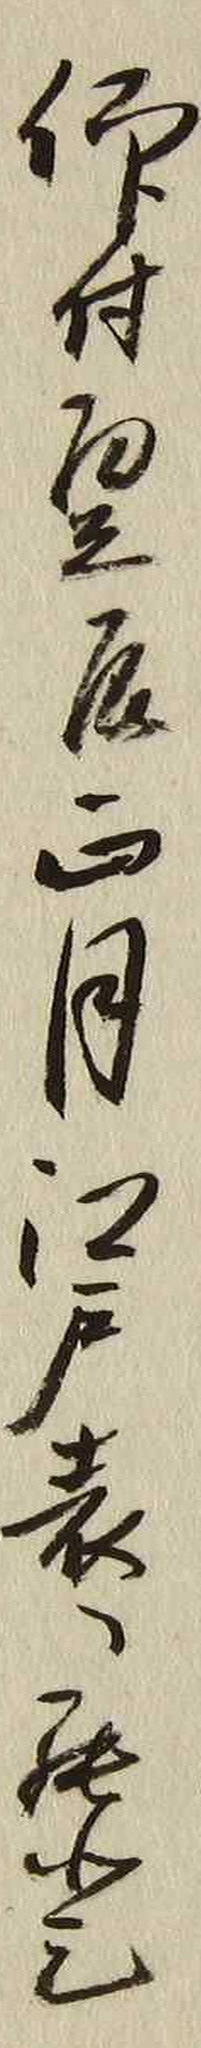仰付翌辰正月江戸表へ罷登
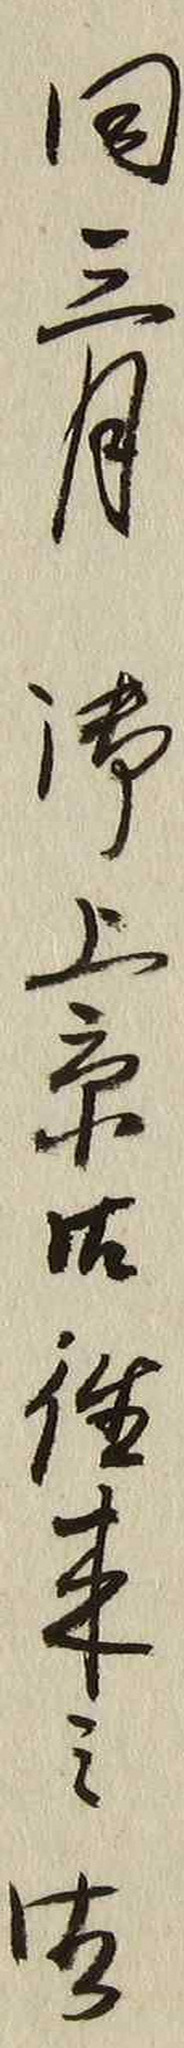同三月御上京御往来之御
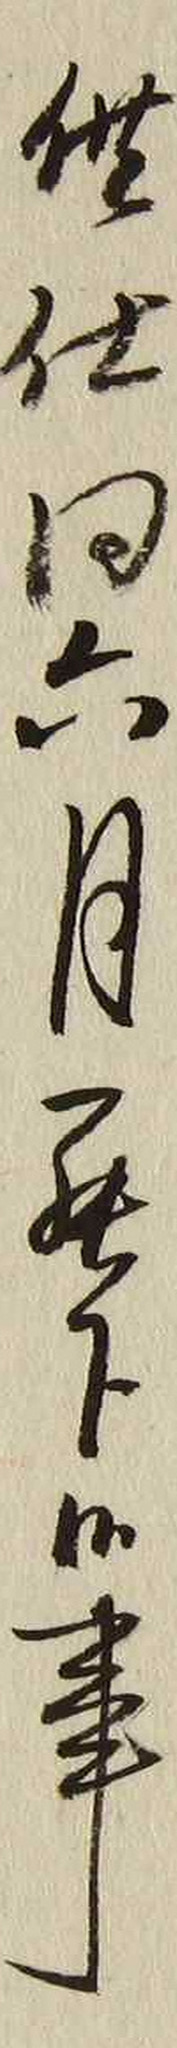供仕同六月罷下候事
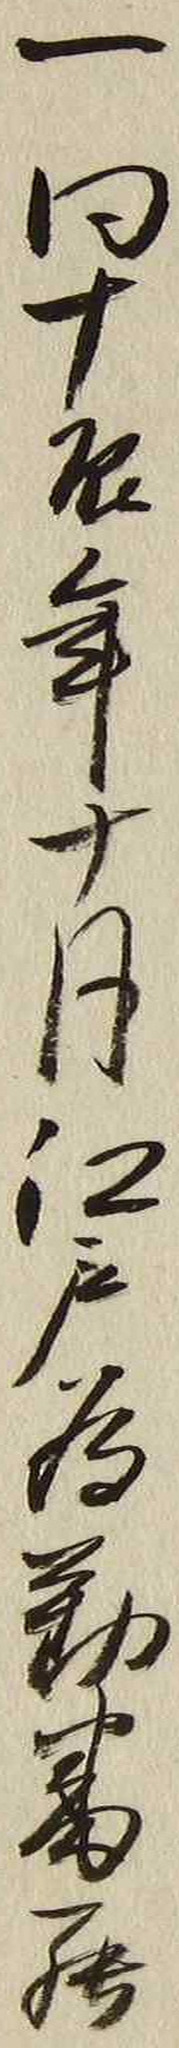一同十辰年十月江戸為勤番罷
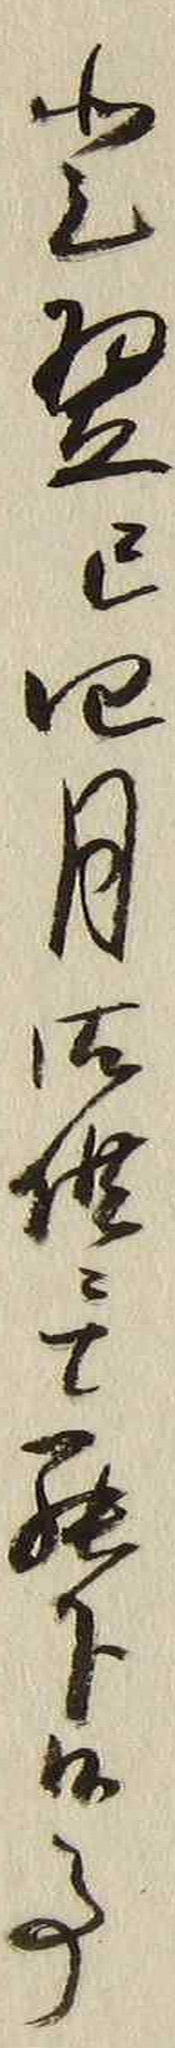登翌巳四月御供ニて罷下候事
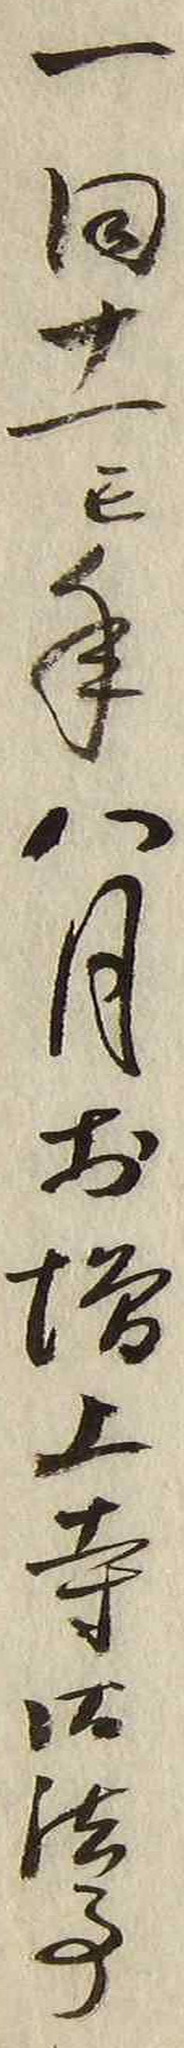一同十一巳年八月於増上寺御法事
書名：諸士系譜　巻之356　す之部6
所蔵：会津若松市立会津図書館
